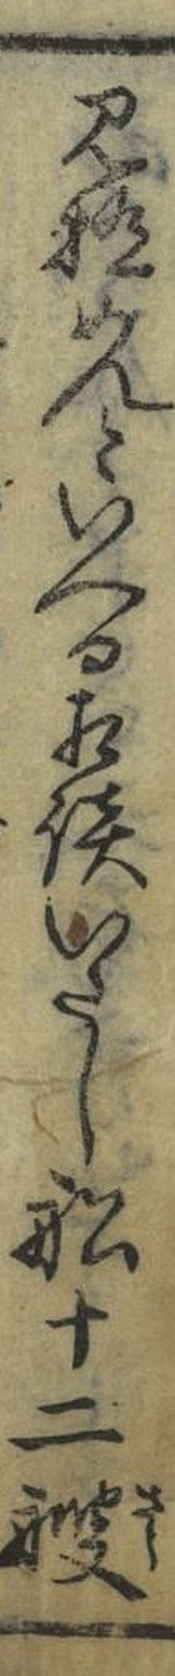見極めんといへる相談いたし船十二艘
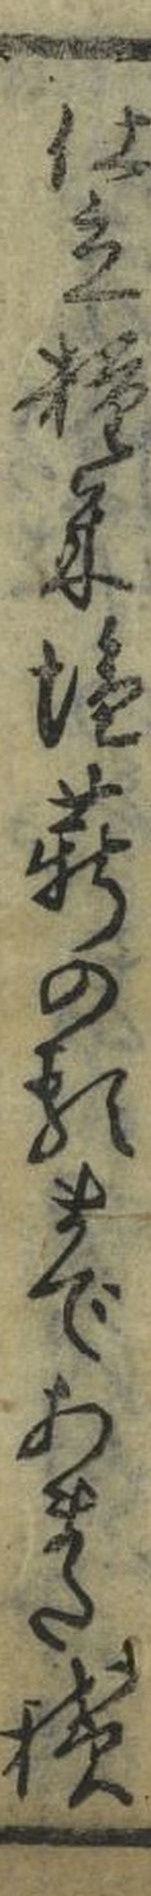仕立糧米塩薪の類まであまた積
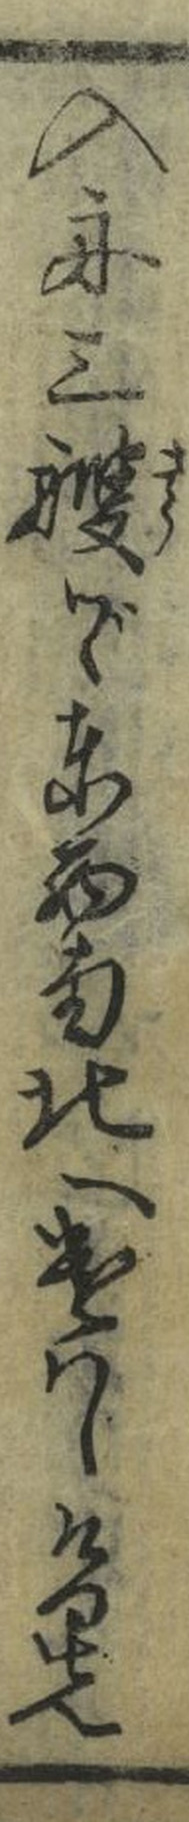入舟三艘で東西南北へ遣はしける先
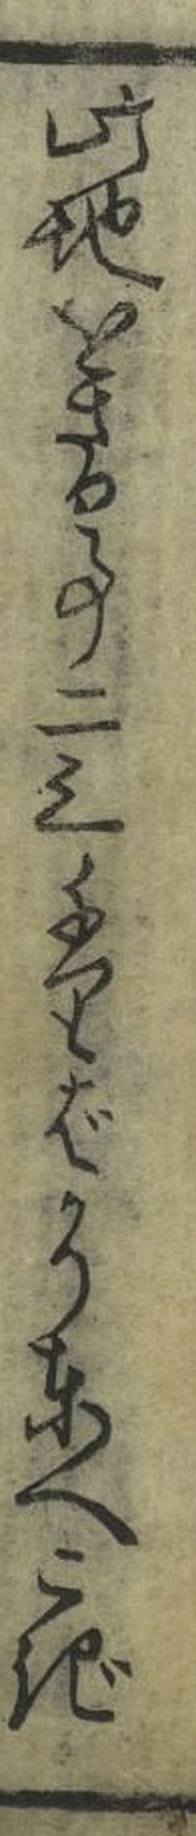此地をさる事二三千里ばかり東へこぎ
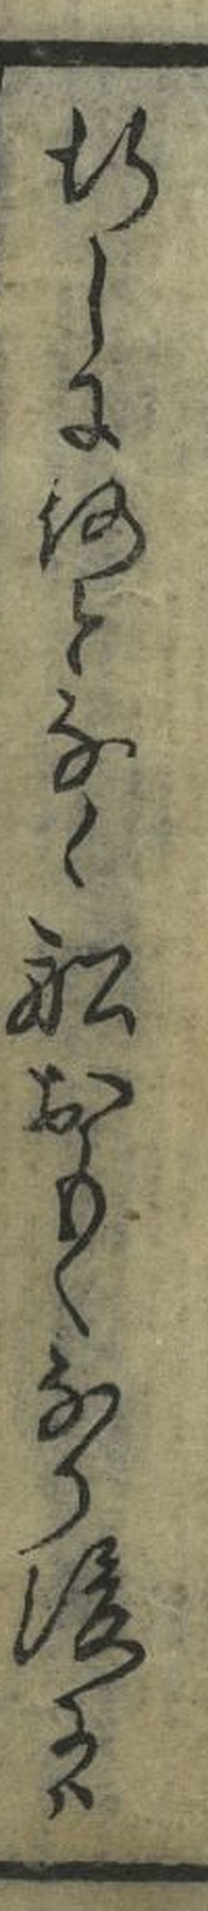行しに何となく船おもくなり後には

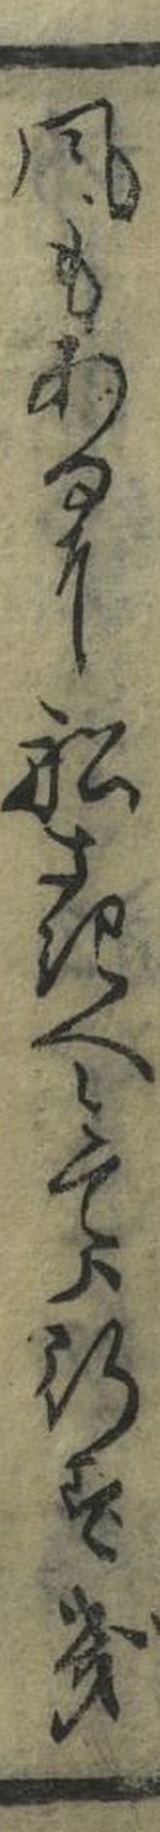風もあるに船さきへとては行す幾
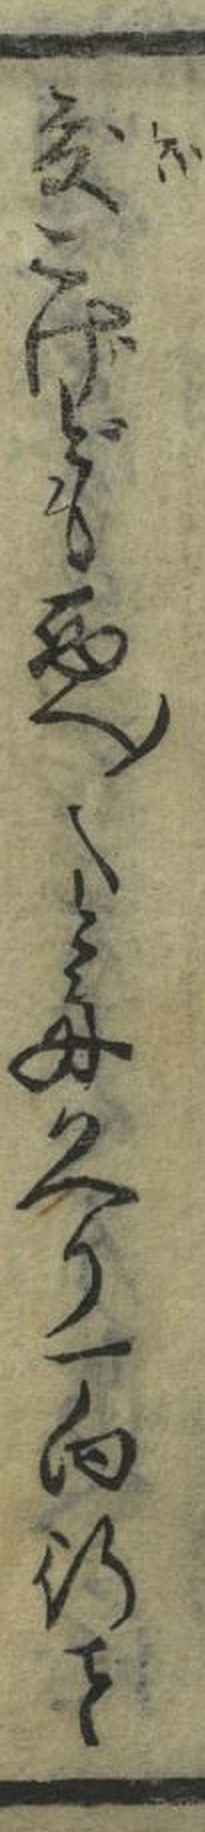度こげども西へ〳〵と舟かへり一向行こと
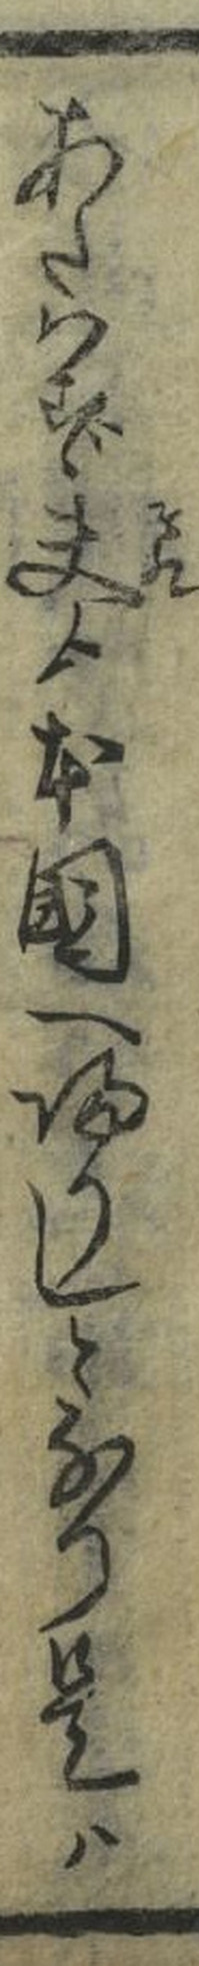あたはず夫ゟ本国へ帰りしとなり是は
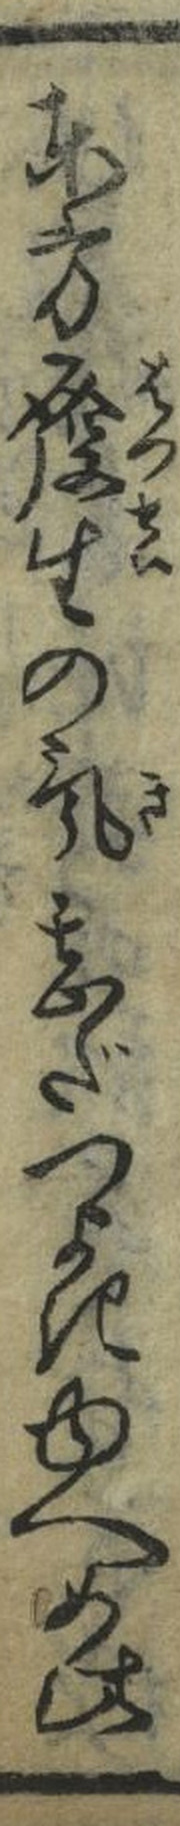東方発生の気甚だつよきゆへ如此
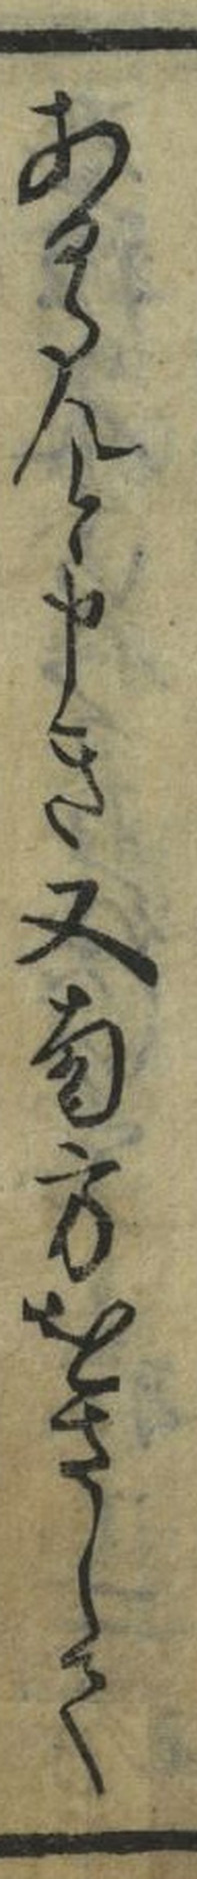あるらんと申き又南方をさして
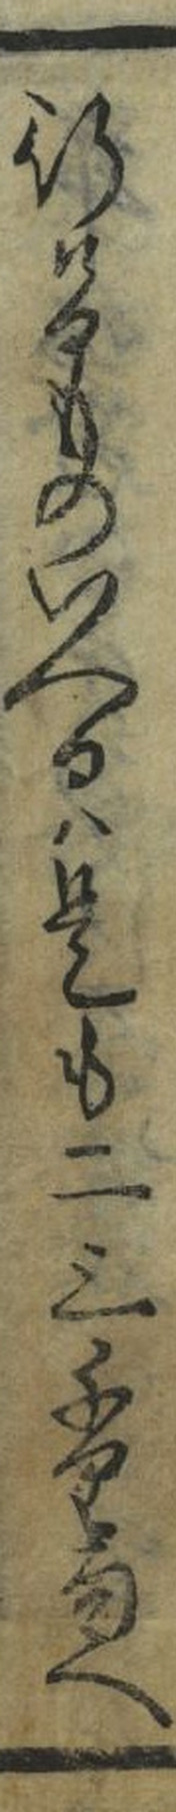行けるものいへるは是も二三千里南へ
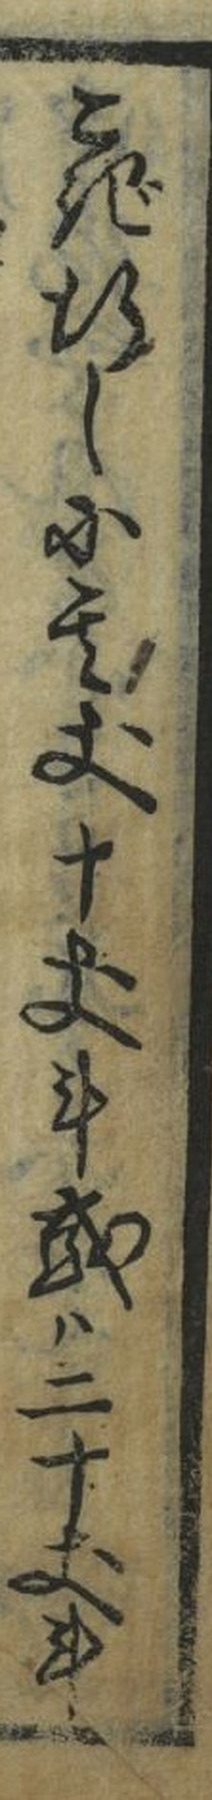こぎ行しに其丈十丈斗或は二十丈斗
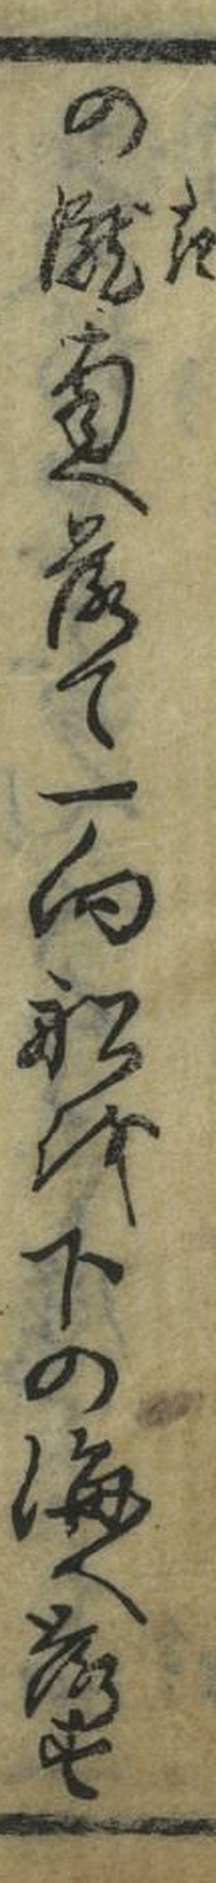の瀧南へ落て一向船を下の海へ落す
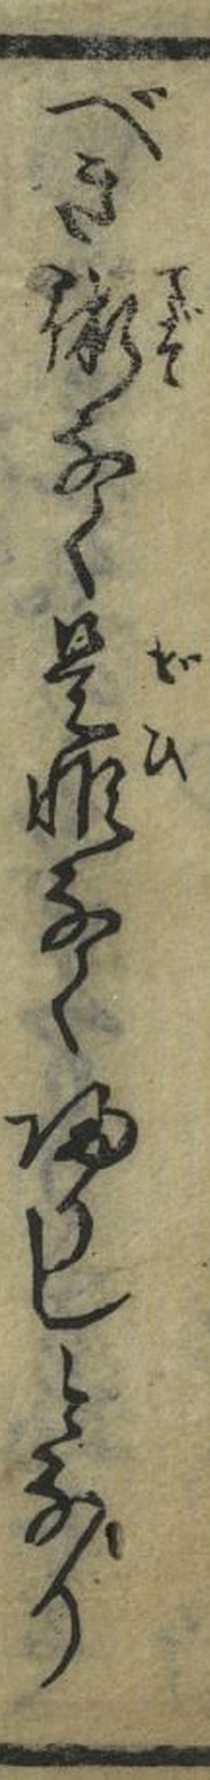べき術なく是非なく帰りしとなり
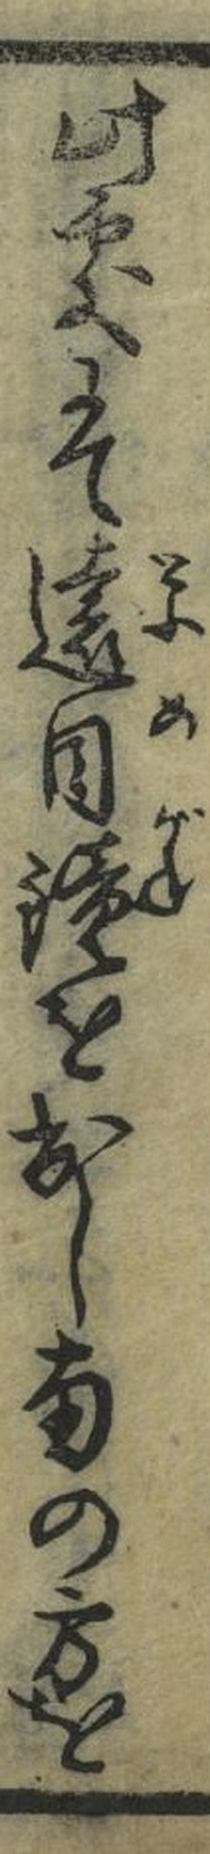此処にて遠目鏡を出し南の方を
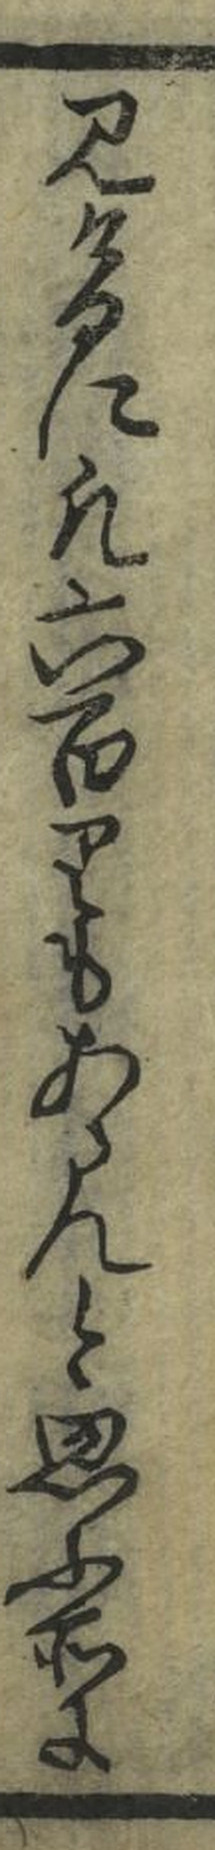見けるに凡六百里もあらんと思ふ所に
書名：琉球雑話
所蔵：University of the Ryukyus Library
